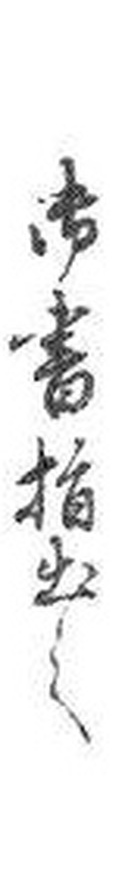御書指出之
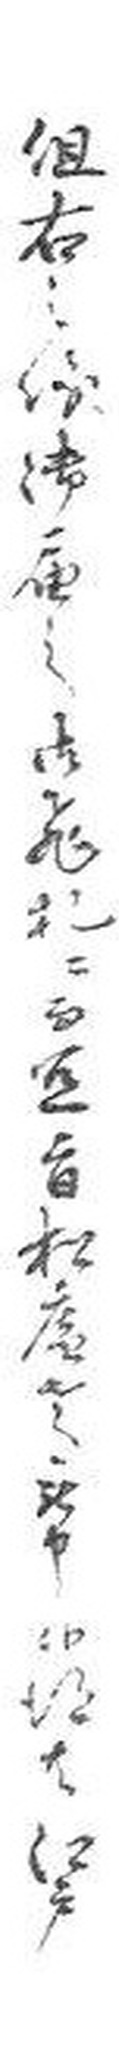但右之儀御届之御飛札ニ而宜旨松庵老被申候得共江戸
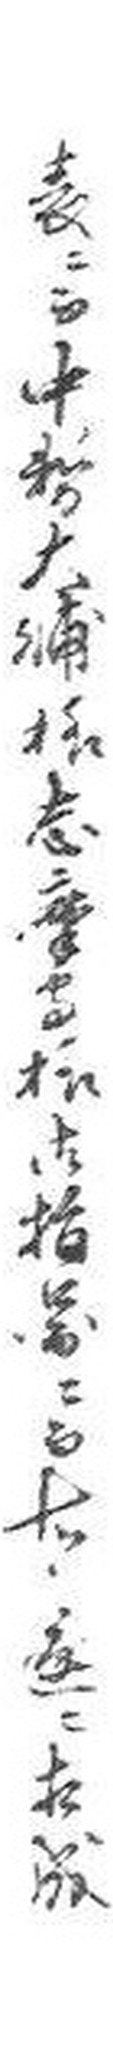表ニ而中務大輔様志摩守様御指図ニ而右之通ニ相成
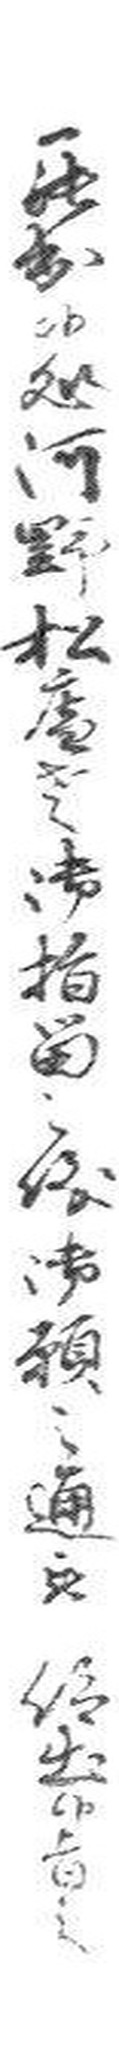罷出候処河野松庵老御指図留之儀御願之通被仰出候旨之
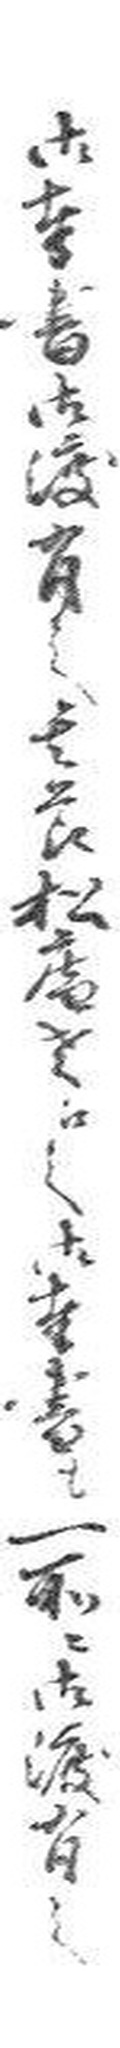御奉書御渡有之其節松庵老江之御奉書も一所ニ御渡有之
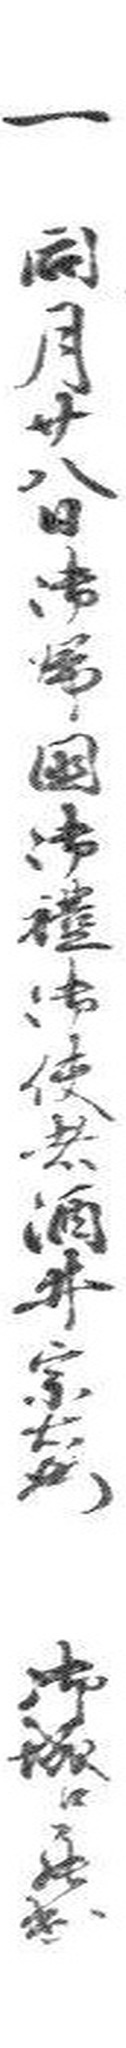一同月廿八日御帰国御礼御使者酒井宗右衛門御城江罷出
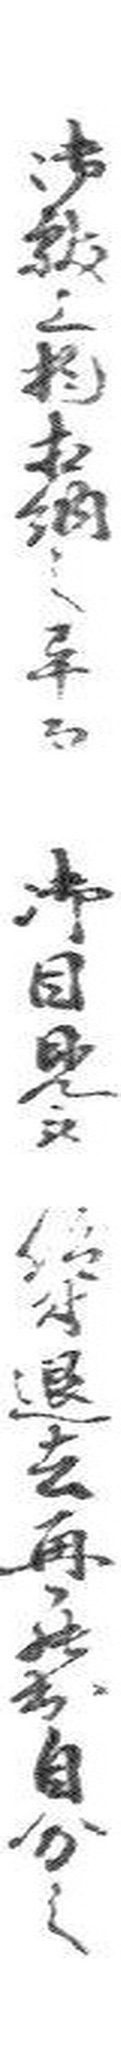御献上物相納之畢而御目見被仰付退去再罷出自分之
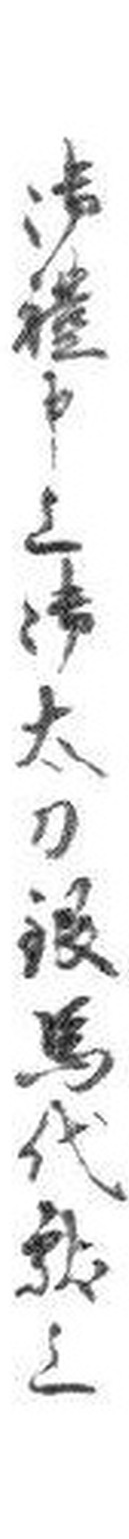御礼申上御太刀銀馬代献上
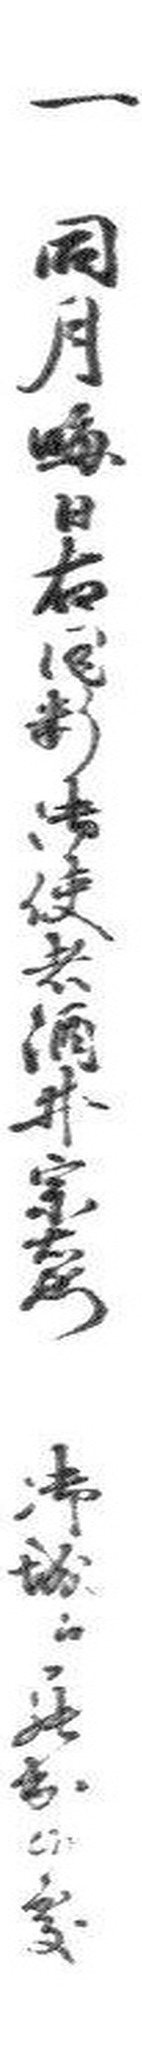一同月晦日右同断御使者酒井宗右衛門御城江罷出候処
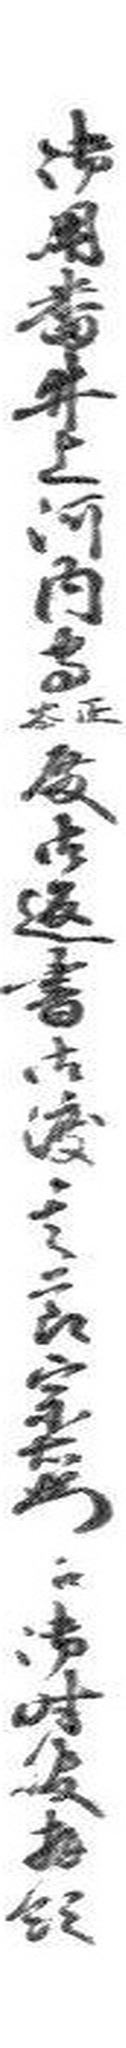御用番井上河内守正岑殿御返書御渡其節宗右衛門江御時服拝領
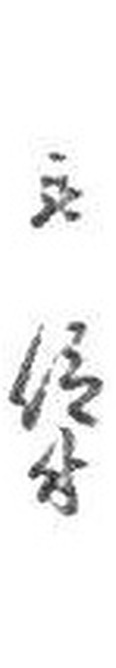被仰付
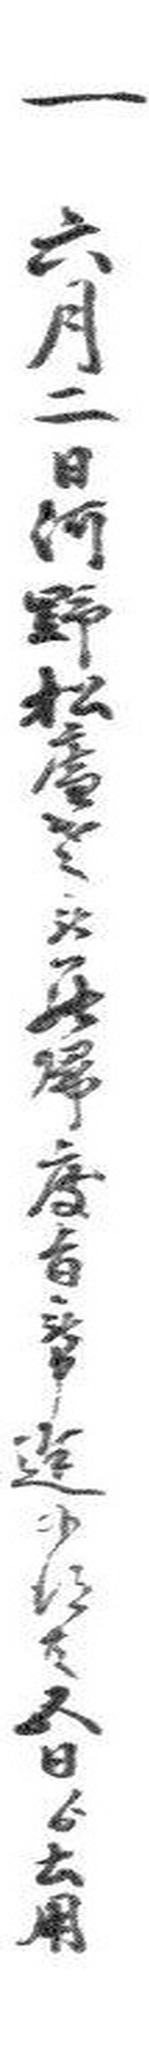一六月二日河野松庵老被罷帰度旨被申進候得共五日ゟ土用
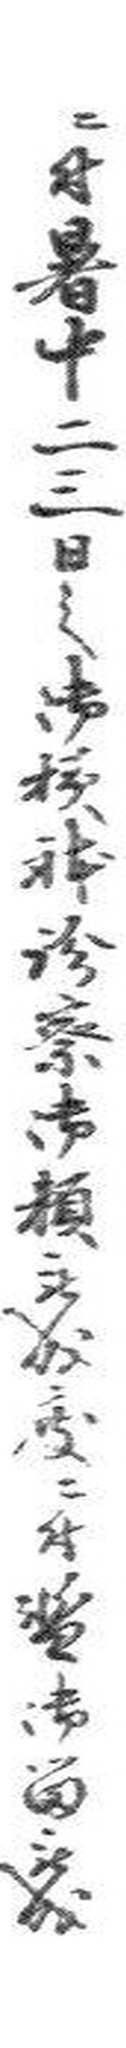ニ付暑中二三日之御様体診察御頼被成度ニ付暫御留被成
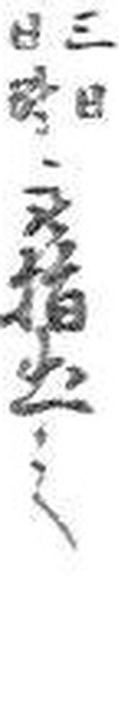御書指出之
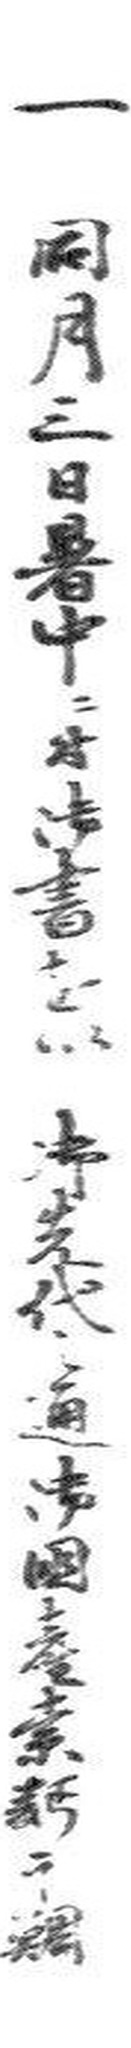一同月三日暑中ニ付御書を以御先代之通御国産索麵干鯛
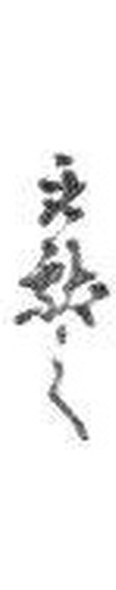被献之
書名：家譜 二十八 吉邦公 従宝永七年七月五日到正徳元年十二月
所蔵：福井県文書館 Fukui Prefectural Archives
